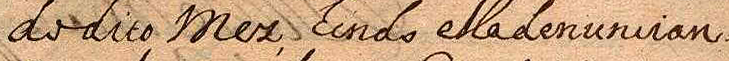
do dito mez, hindo ella denuncian
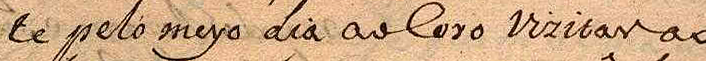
te pelo meyo dia ao Coro vizitar ao
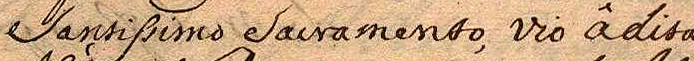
Santissimo Sacramento, vio â dita
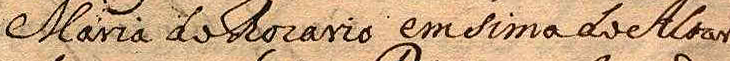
Maria do Rozario em sima do Altar
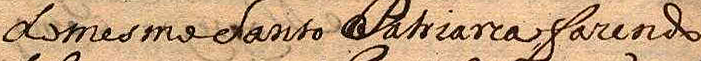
do mesmo Santo Patriarca, fazendo
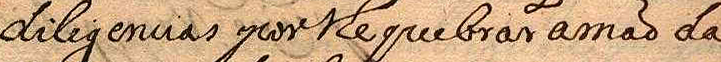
diligencias por lhe quebrar a maõ da
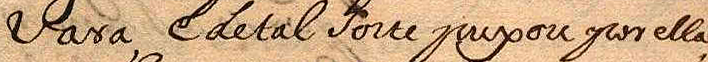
Vara, e de tal sorte puxou por ella,
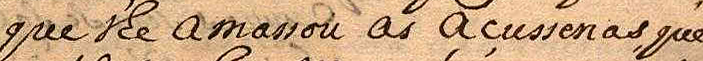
que lhe amassou as açussenas, que
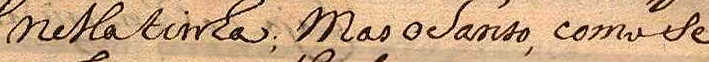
nella tinha; mas o Santo, como se
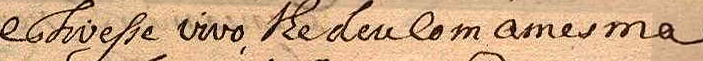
estivesse vivo, lhe deu com a mesma
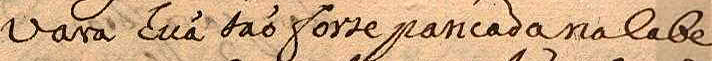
vara huā taõ forte pancada na Cabe
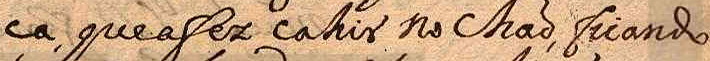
ça, que a fez cahir no chaõ, ficando
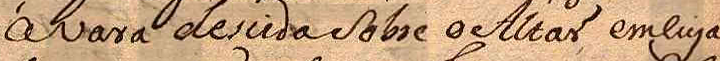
a vara descida sobre o Altar, em cuja
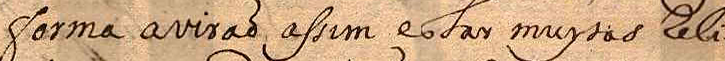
forma a viraõ assim estar muytas Reli
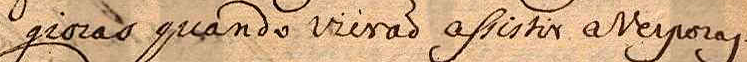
giozas quando vieraõ assistir a Vesporas.
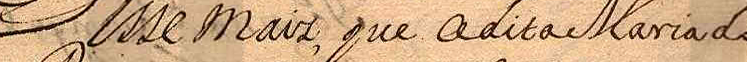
Disse maiz, que a dita Maria do
